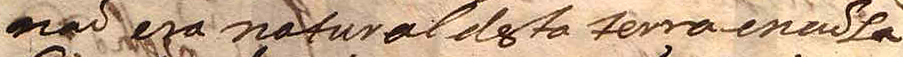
naõ era natural desta terra e naõ sa
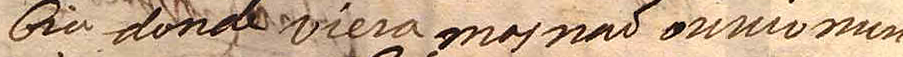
bia donde viera mas naõ ouuio nun
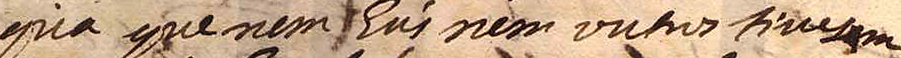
qua que nem hūs nem outros tiuesem
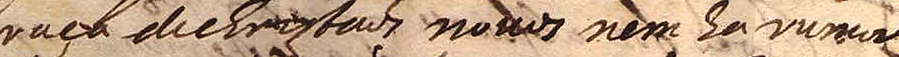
raça de christaõs nouos nem ha rumor
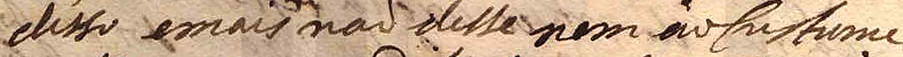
disso e mais naõ disse nem ao Custume
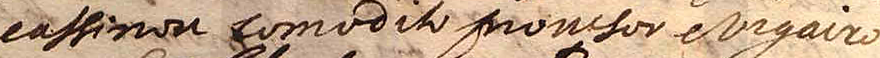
e assinou com o dito prouisor e vigairo
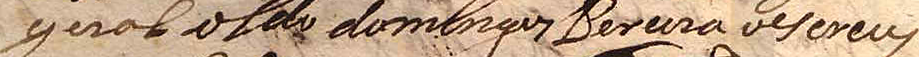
geral o Ldo domingos Pereira o escreuj
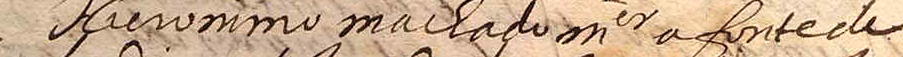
Ta Hieronimo machado mor a fonte de
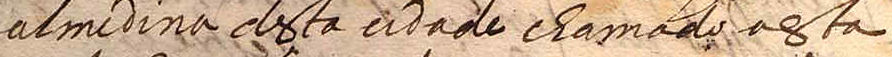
almedina desta cidade chamado a esta
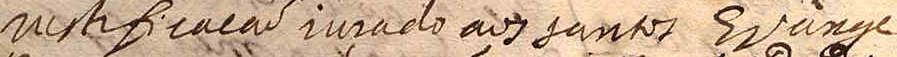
iustificacaõ iurado aos santos Evange
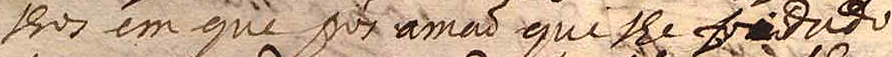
lhos em que pōs a maõ que lhe foi dado
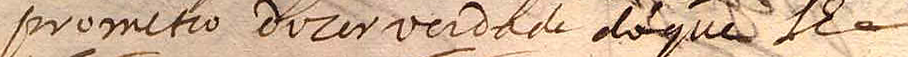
prometeo dizer verdade do que lhe
